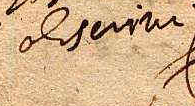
o Escriui
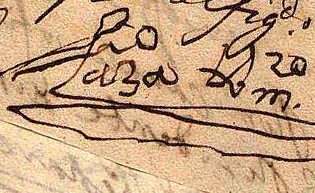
Laza Rom.ro
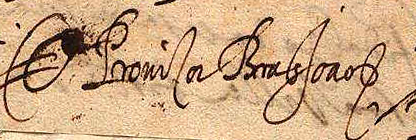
O Prouizor Bras Joaõ
